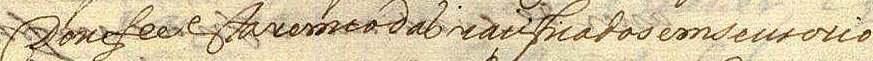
Dou fee estarem todas ratificadas em seus orio
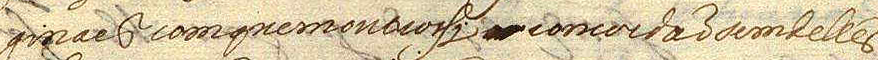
ginaes com quem outrossi concordaõ sem delles
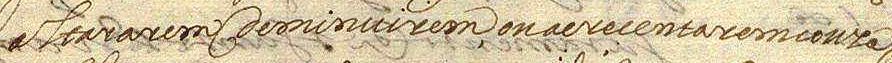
altararem deminuirem, ou acrecentarem couza
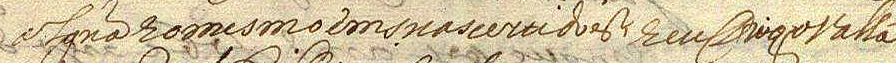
alguā E o mesmo em suas certidoes E eu Diogo Valla
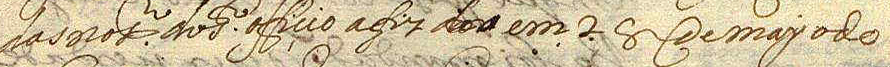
das not.ro do s.to offiçio a fiz _ em 28 de mayo de
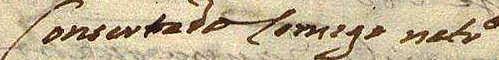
Consertado comigo notro
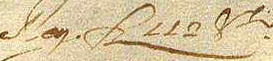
Reg. fl 112 Vso.
